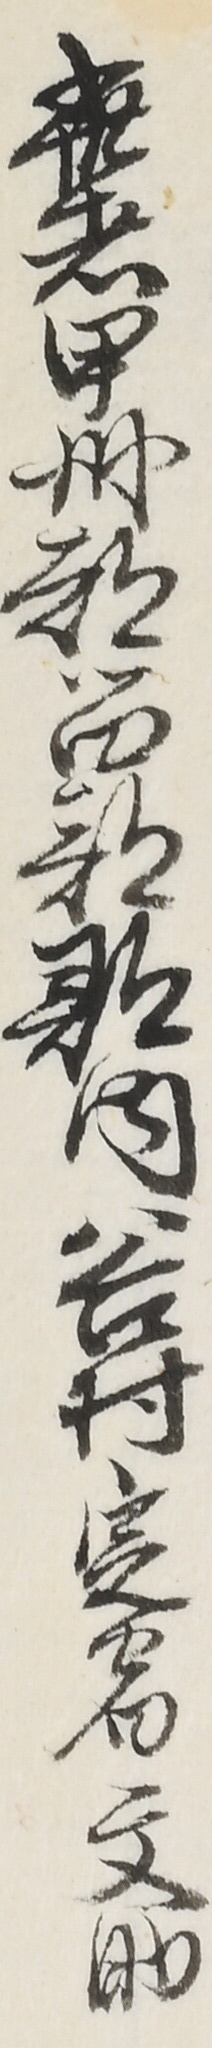此者甲州都留郡郡内谷村定宿文助
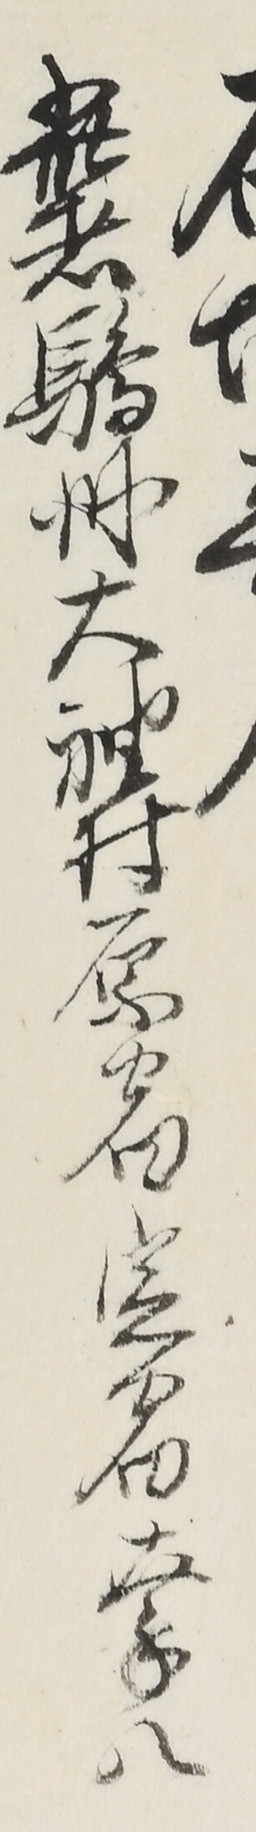此者駿州大袖村原宿定宿幸八
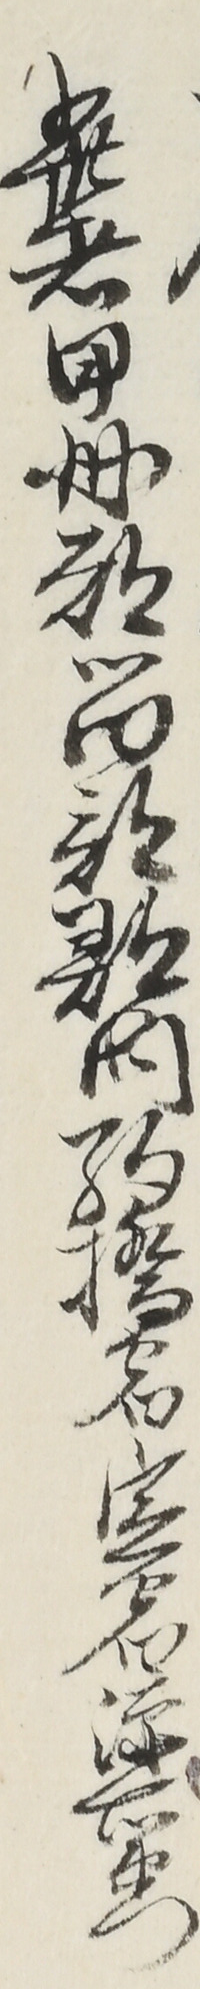此者甲州都留郡郡内駒橋宿定宿源右衛門

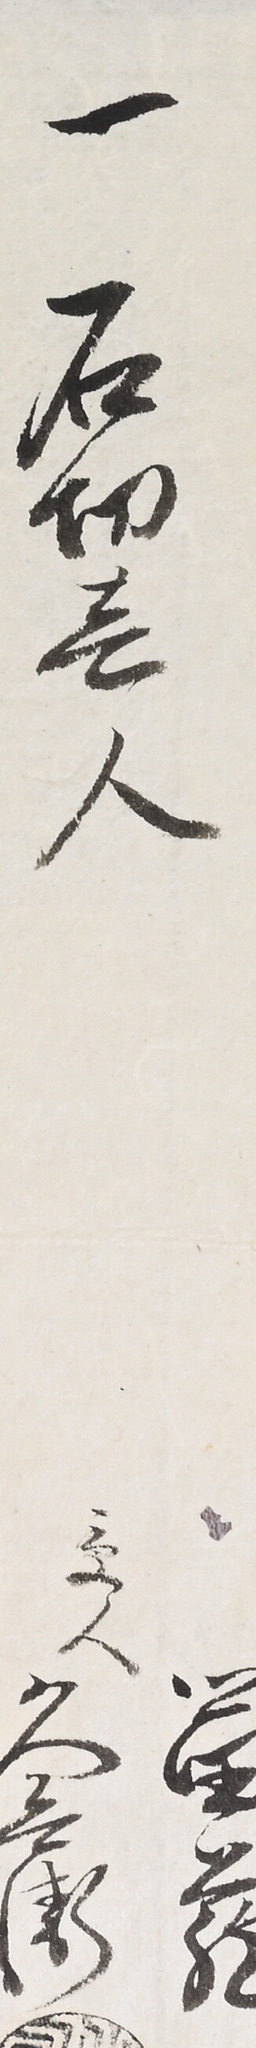一石切壱人万兵衛
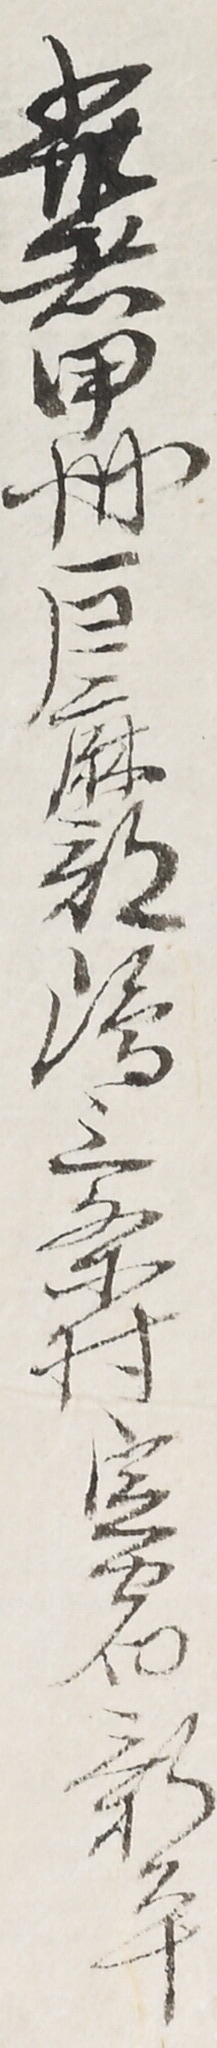此者甲州巨摩郡島上条村定宿新平
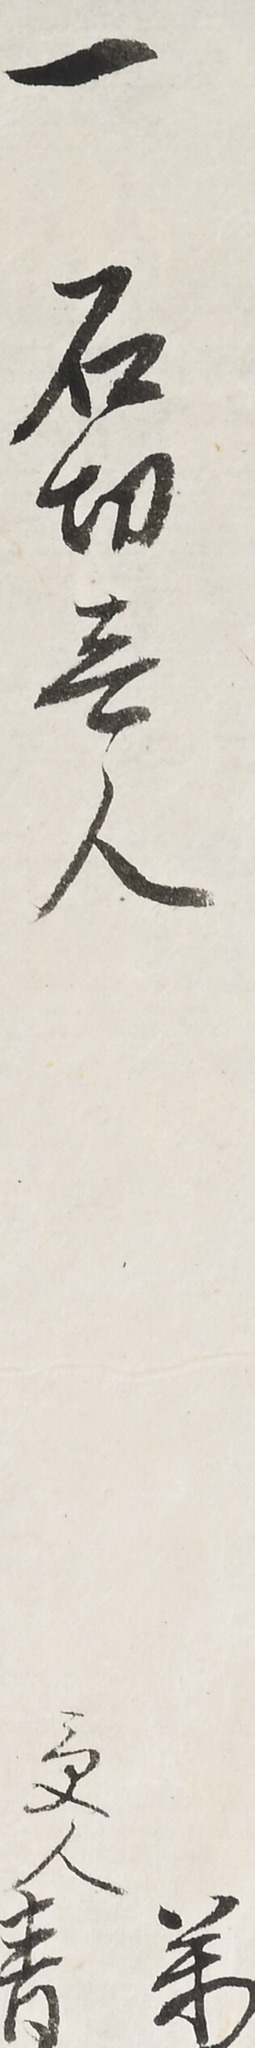一石切壱人富蔵
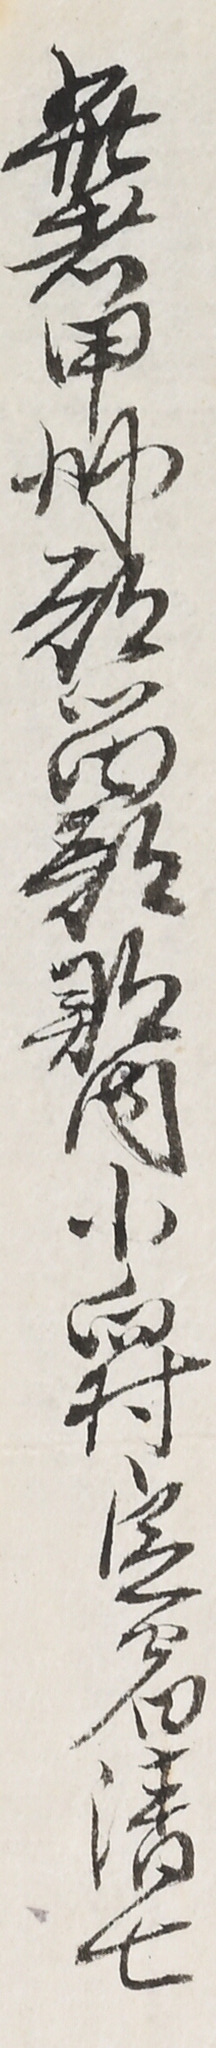此者甲州都留郡郡内小向村定宿清七
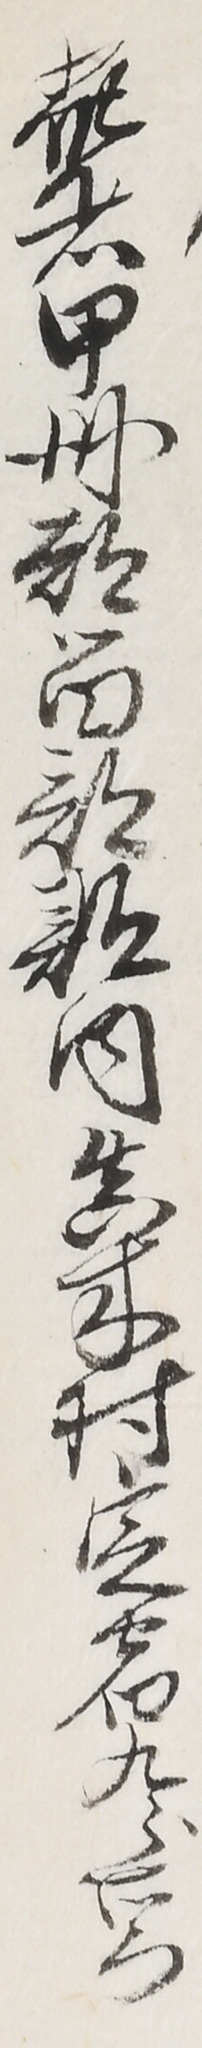此者甲州都留郡郡内真木村定宿九郎右衛門
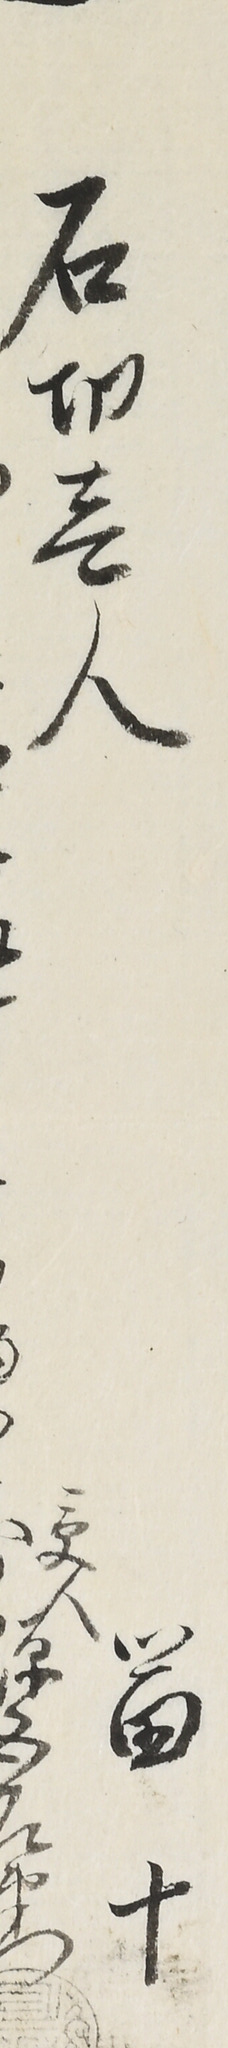一石切壱人富十

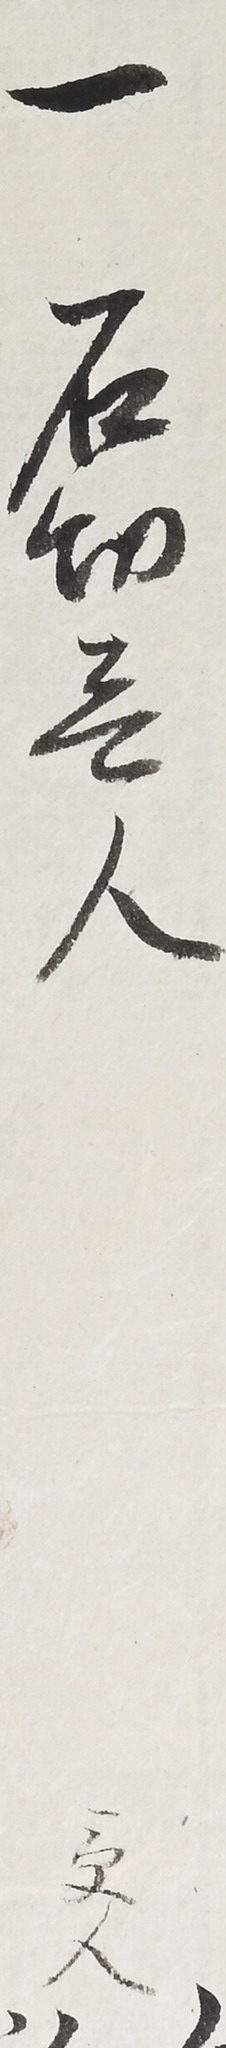一石切壱人善五郎
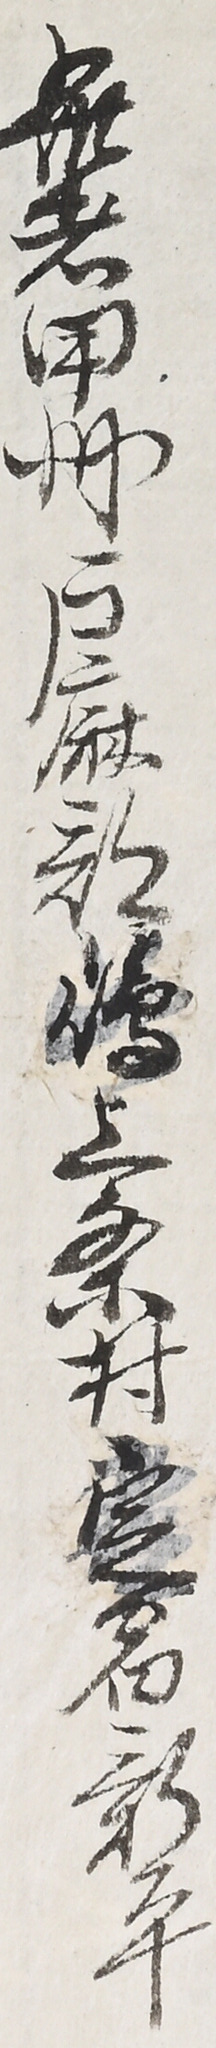此者甲州巨摩郡島上条村定宿新平
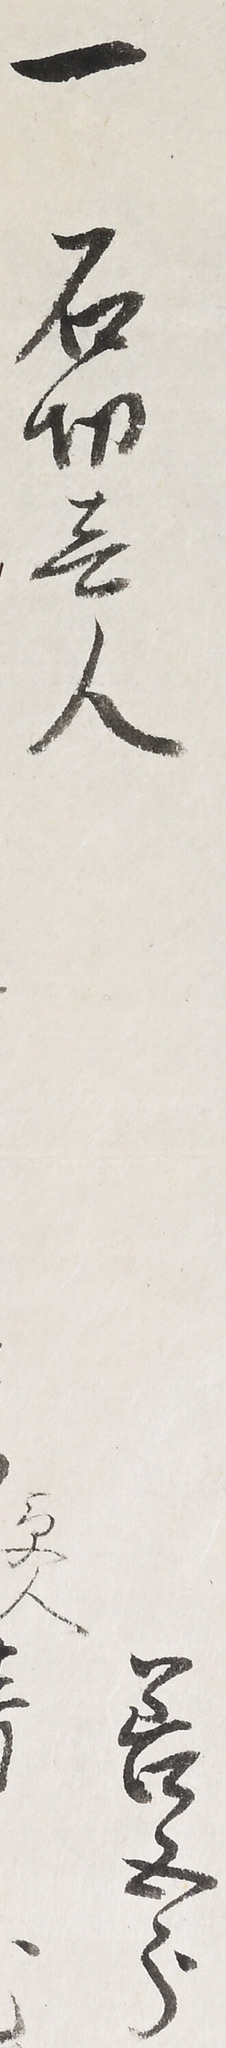一石切壱人善五郎
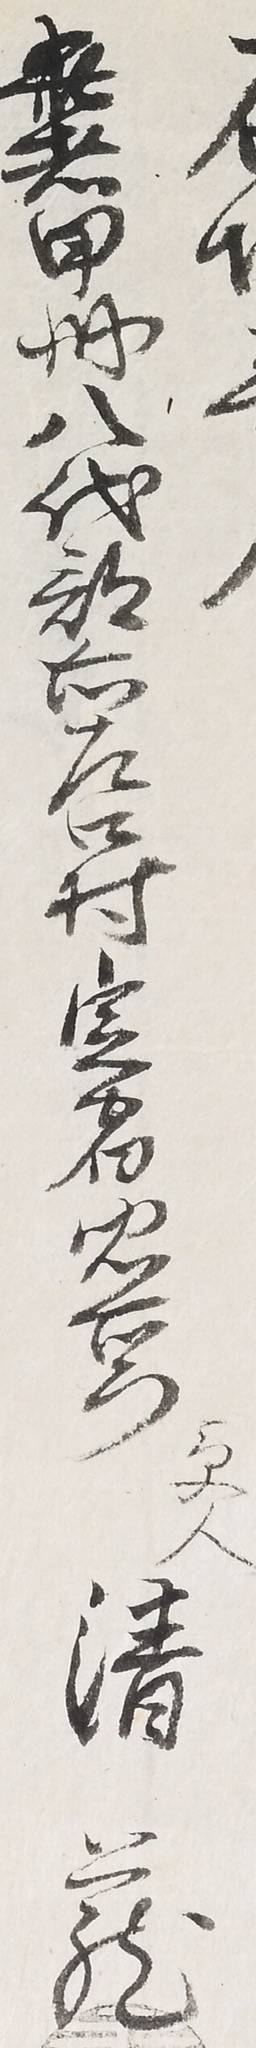此者甲州八代郡右左口村定宿忠右衛門受人清蔵
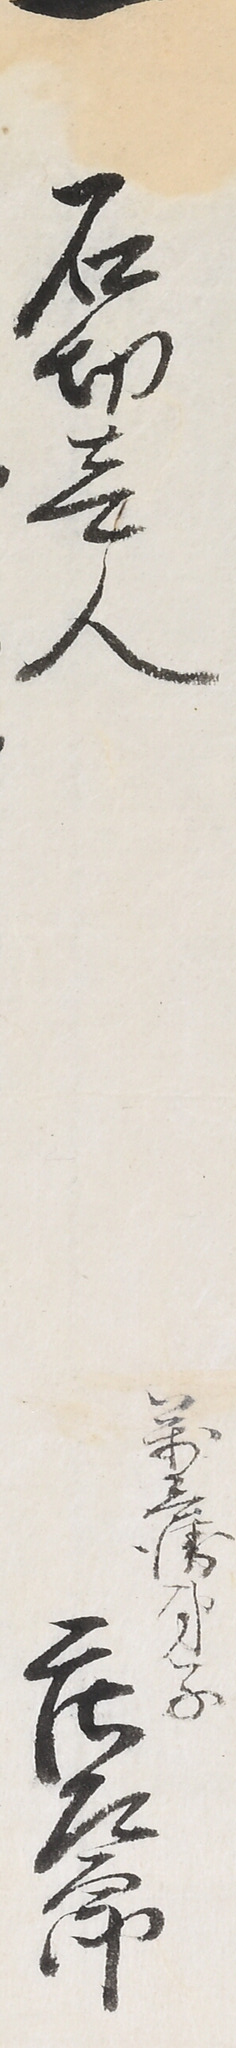一石切壱人伊左衛門
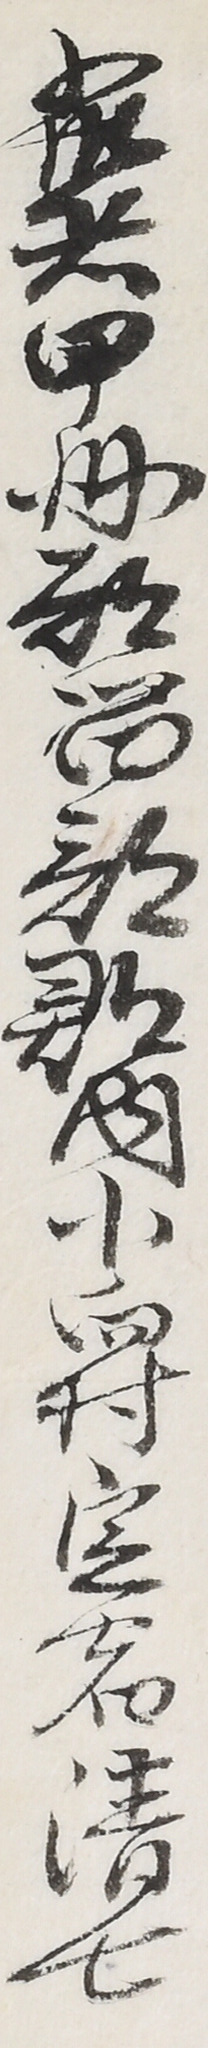此者甲州都留郡郡内小向村定宿清七
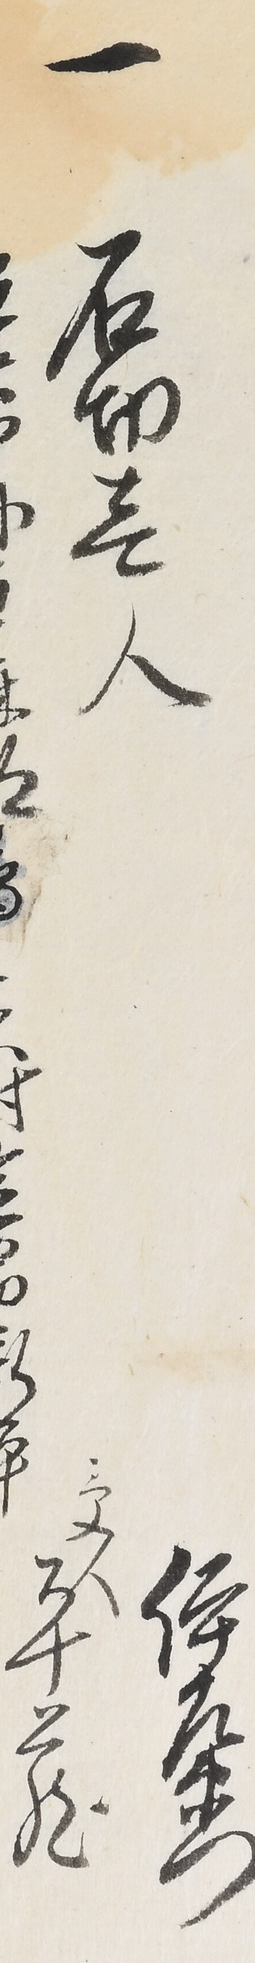一石切壱人善五郎
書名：嘉永五壬子年二月他國出石切名前書上帳
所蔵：伊那市立高遠町図書館・合同会社AMANE
